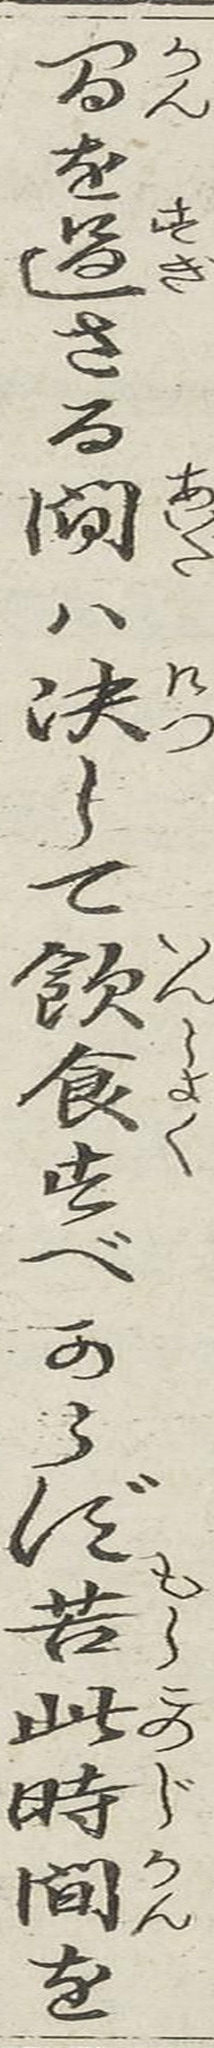間を過さる間は決して飲食すべからず若此時間を
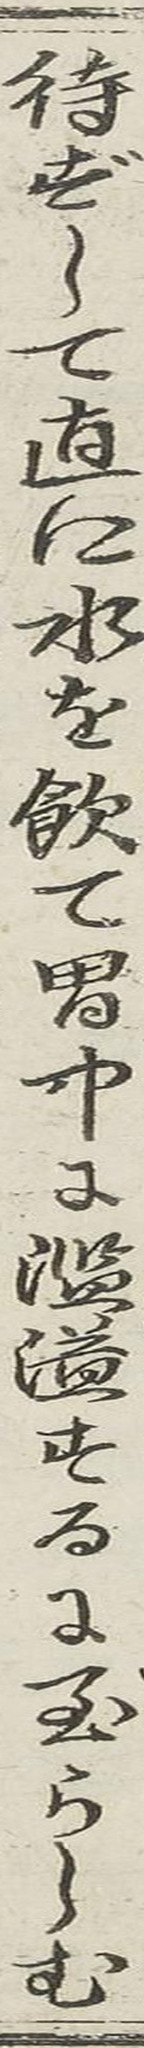待ずして直に水を飲て胃中に濫溢するに至らしむ
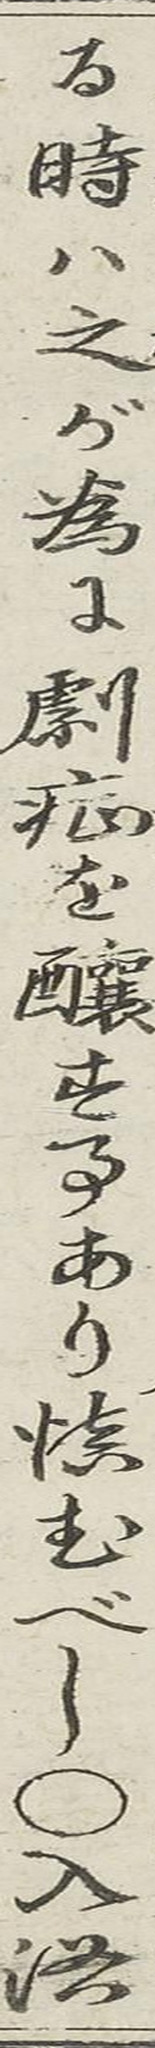る時は之が為に劇症を醸す事あり慎むべし○入浴
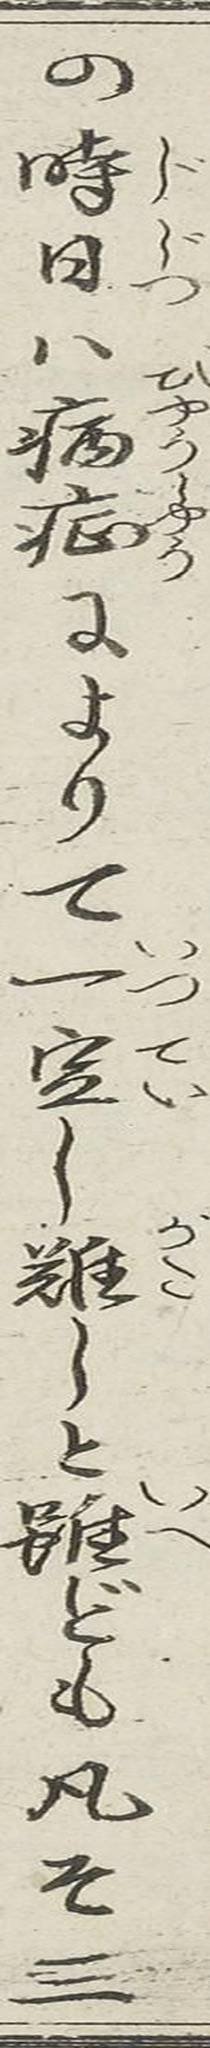の時日は病症によりて一定し難しと雖ども凡そ三
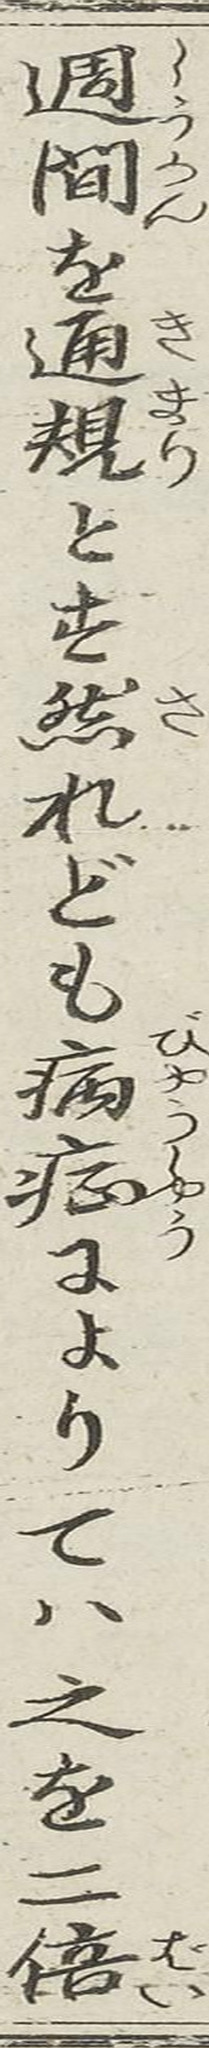週間を通規とす然れども病症によりては之を二倍
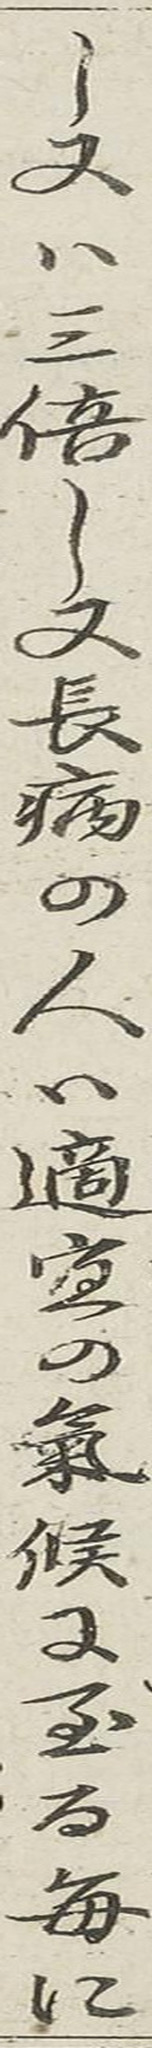し又は三倍し又長病の人は適宜の気候に至る毎に
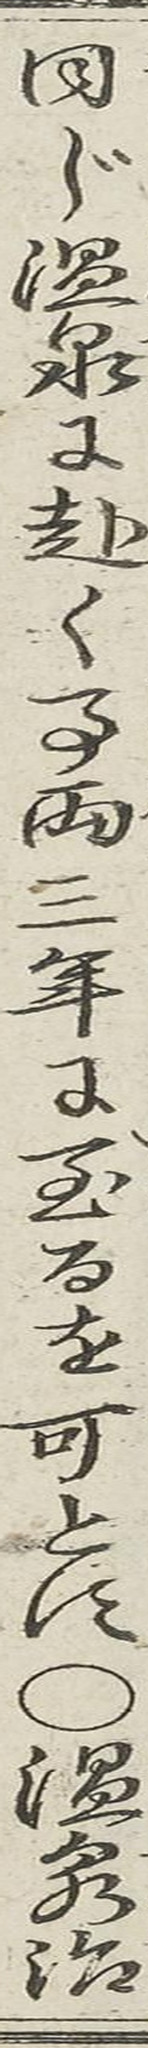同じ温泉に赴く事両三年に至るを可とす○温泉治
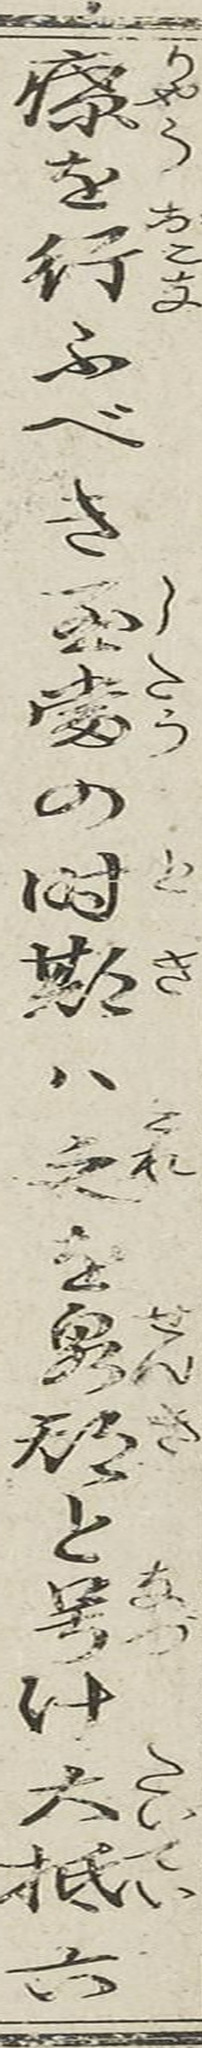療うを行ふべき至当の時期は之を泉期と号け大抵六
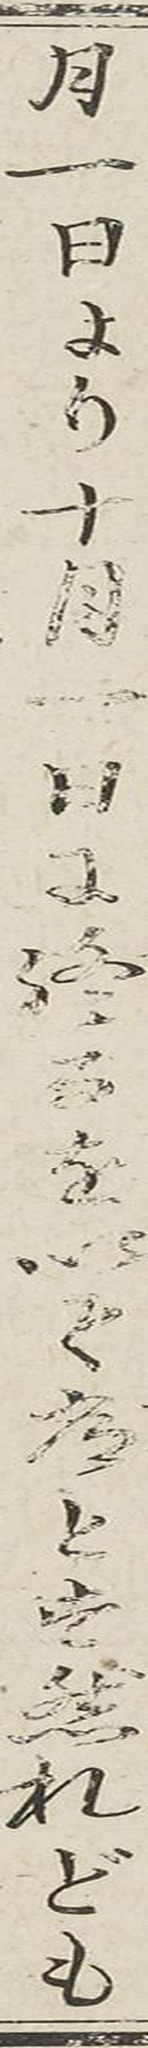月一日より十月一日に終るを以て常とす然れども
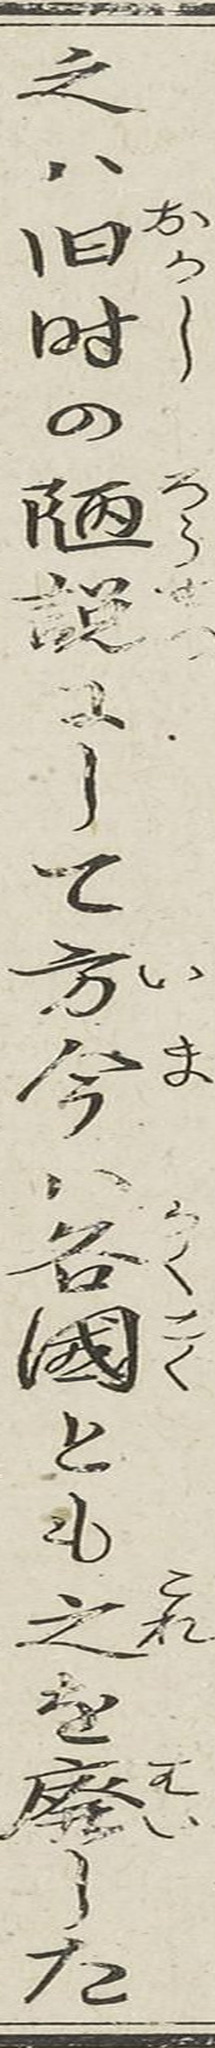之は旧時の陋説にして方今は各国とも之を廃した
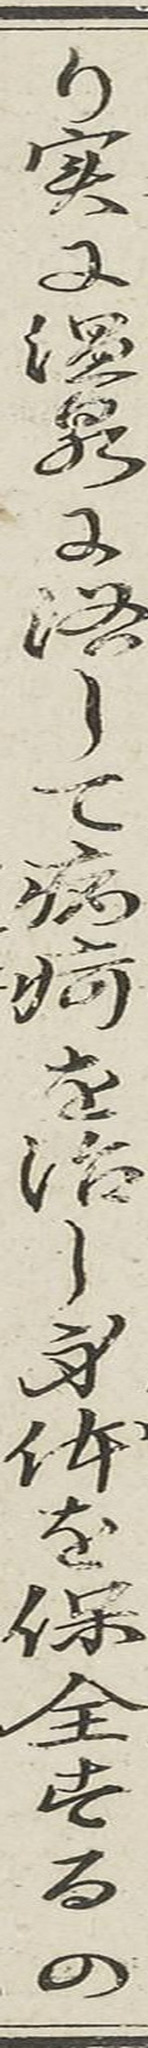り実に温泉に浴して病痾を治し身体を保全するの
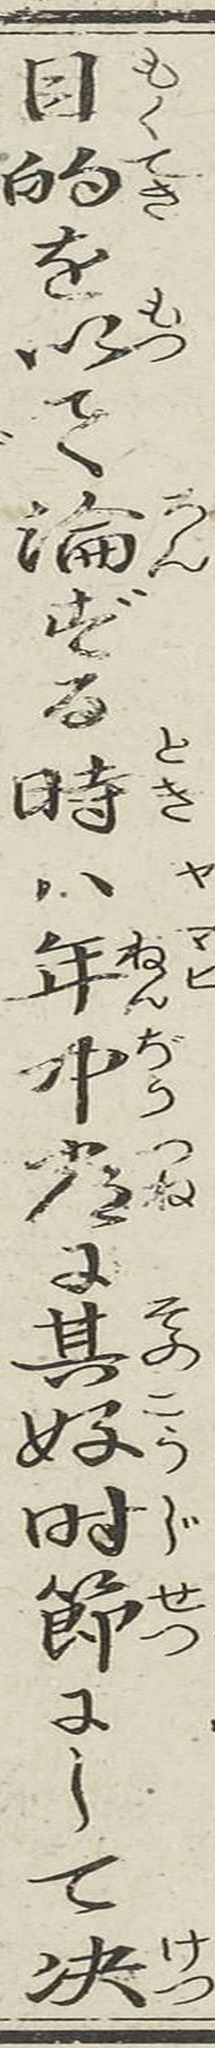目的を以て論ずる時は年中常に其好時節にして決
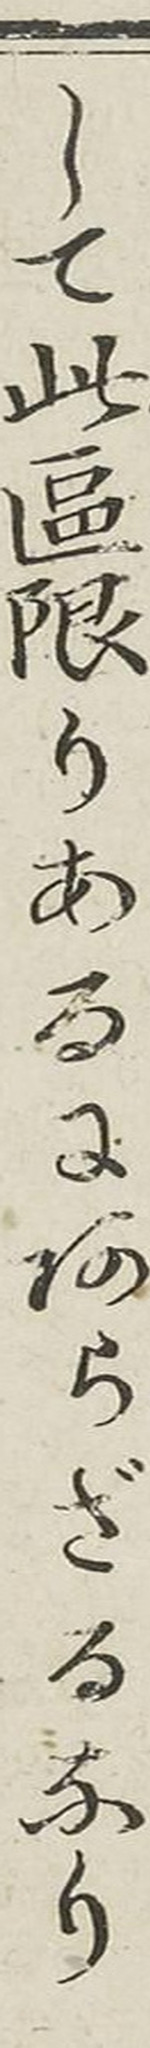して此区限りあるにあらざるなり
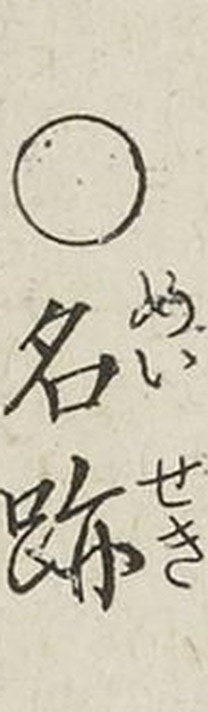○名跡
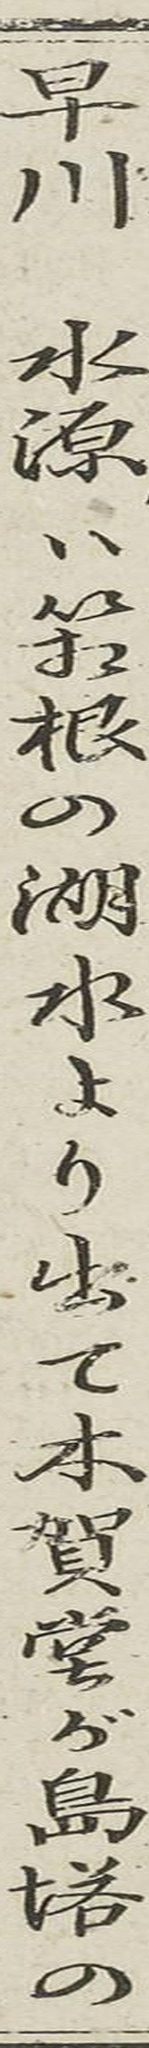早川水源は箱根の湖水より出て木賀堂が島塔の
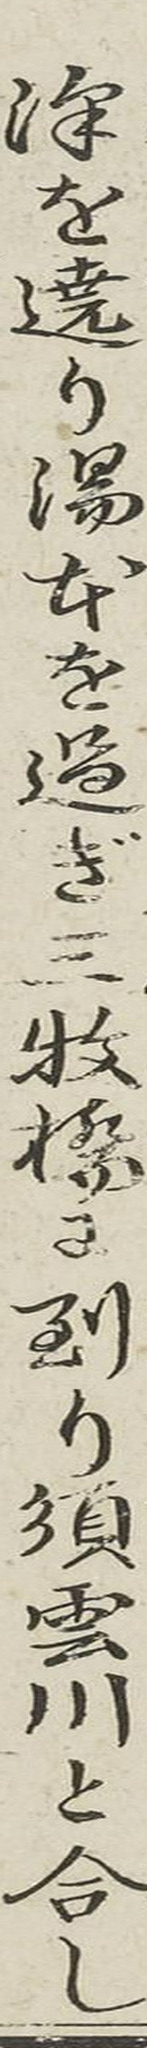沢を遶り湯本を過ぎ三枚橋に到り須雲川と合し
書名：箱根温泉誌　全
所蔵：東京大学地震研究所図書室 Earthquake Research Institute Library, The University of Tokyo, JAPAN
